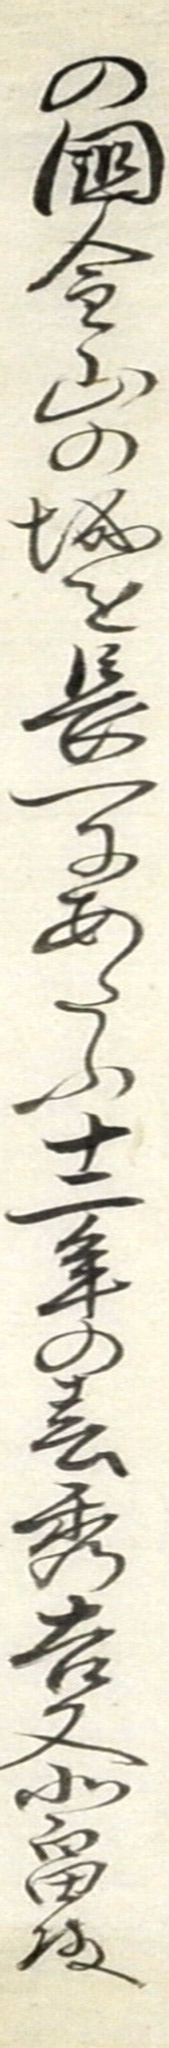の国金山の城を長一にあたふ十二年の春秀吉又北畠殿
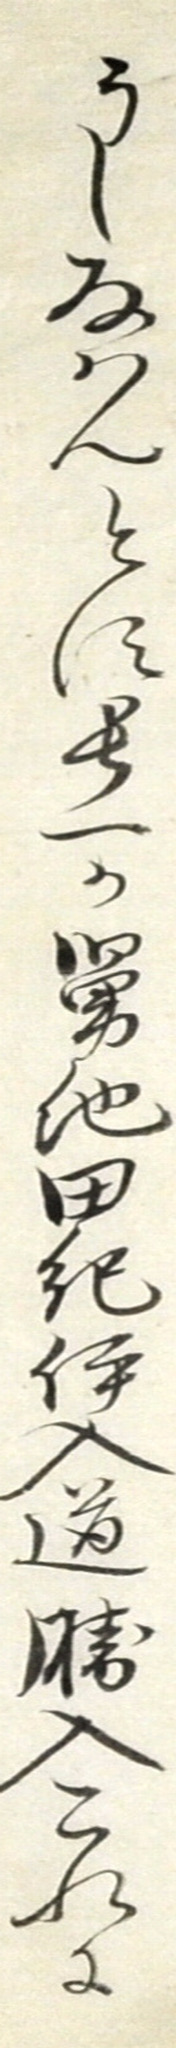うしなはんとす長一か舅池田紀伊入道勝入これに
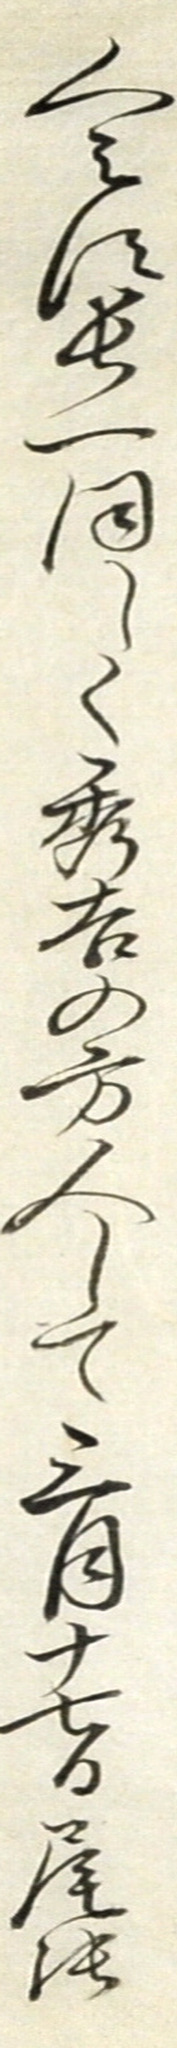くみす長一同しく秀吉の方人して三月十七日尾張
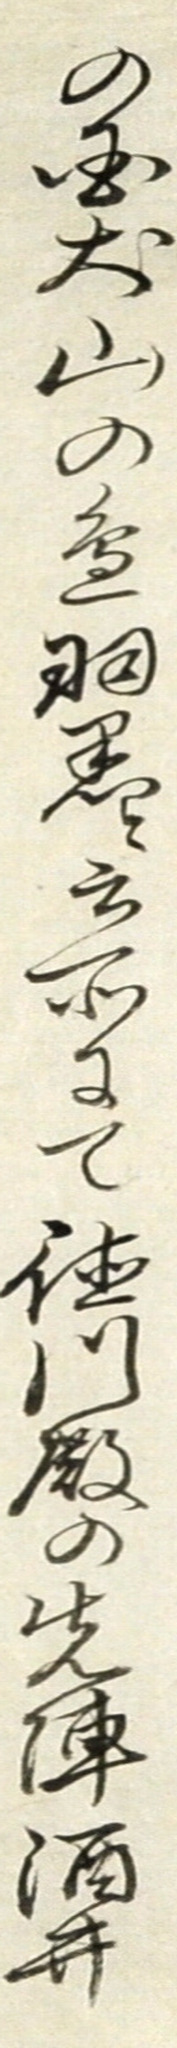の国犬山の辺羽黒と云所にて徳川殿の先陣酒井
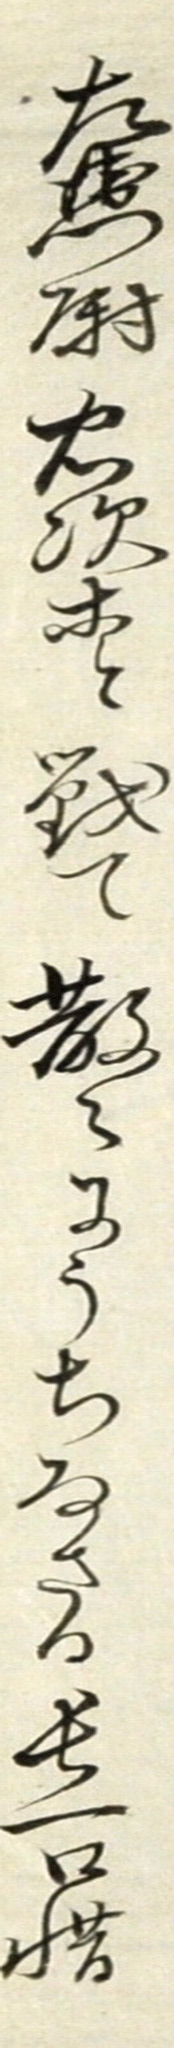左衛門尉忠次等と戦て散々にうちなさる長一口惜
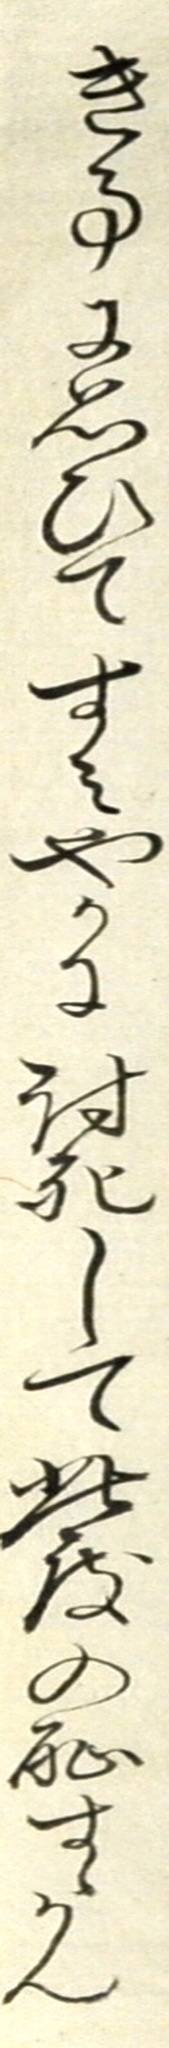き事に思ひてすみやかに討死して此度の恥すゝかん

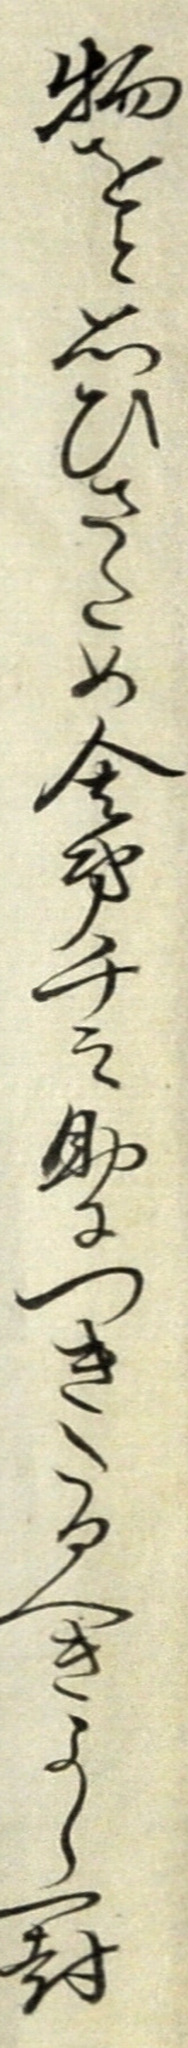物をと思ひさため舎弟千之助につきたるへきよし一封
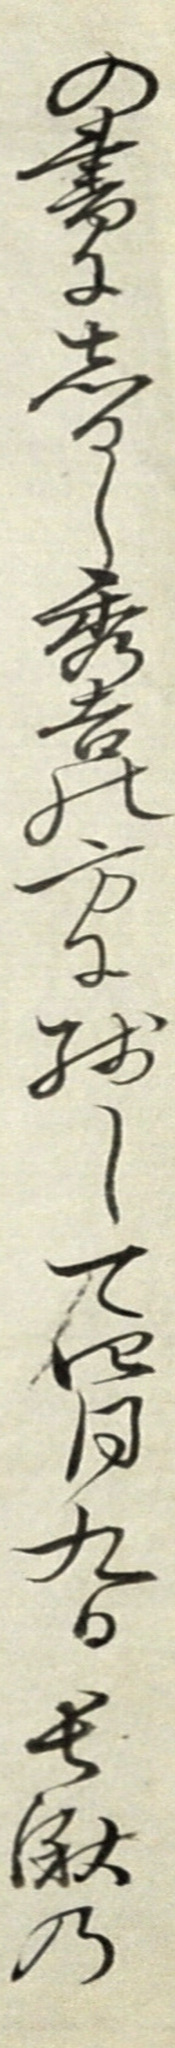の書にしるし秀吉の方に残して四月九日長湫の
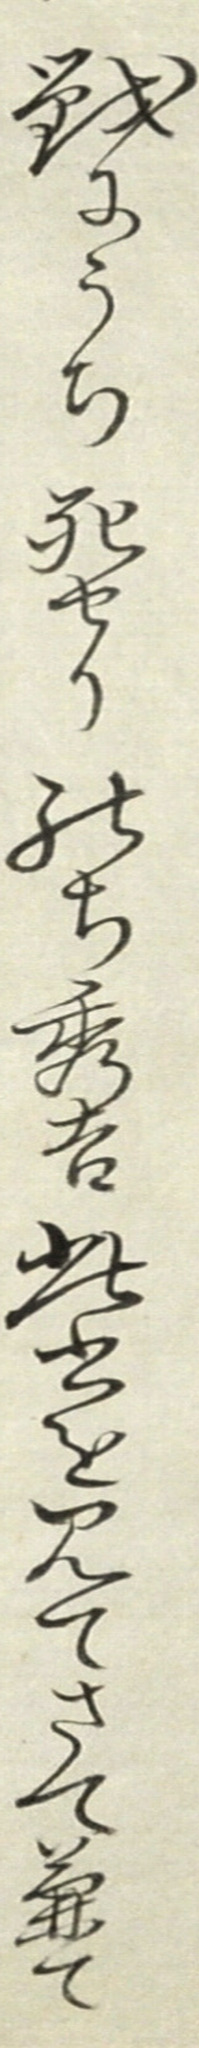戦にうち死せりのち秀吉此書を見てさて兼て
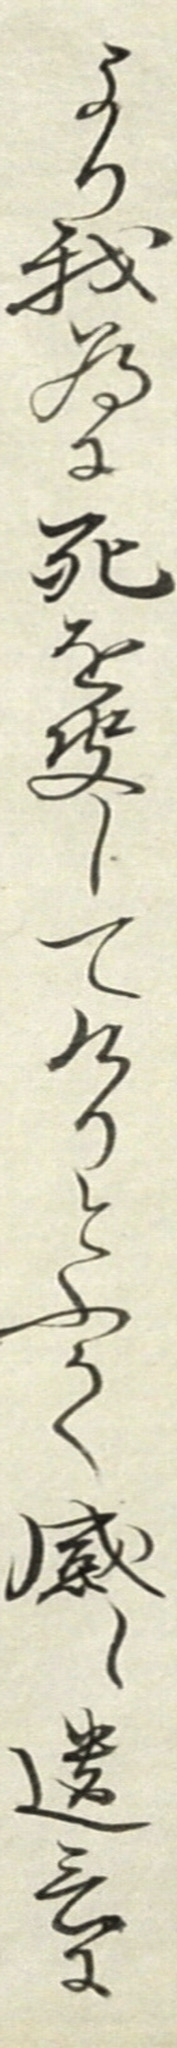より我為に死を決してけりとふかく感し遺言に
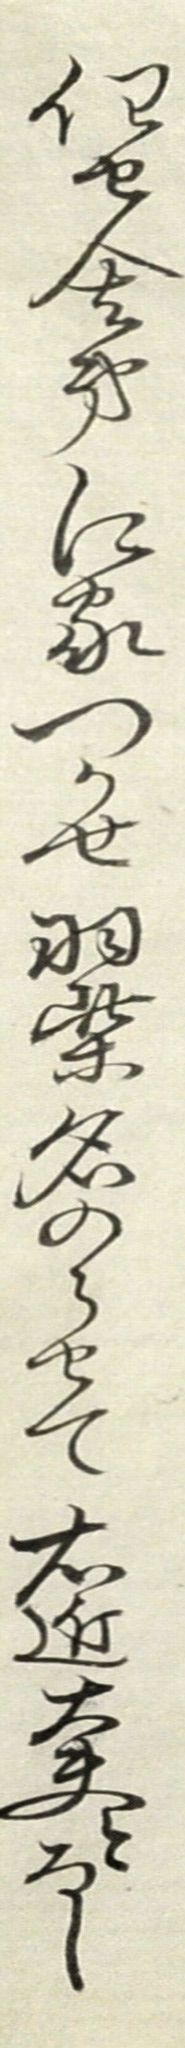任せ舎弟に家つかせ羽柴名のらせて右近大夫となし
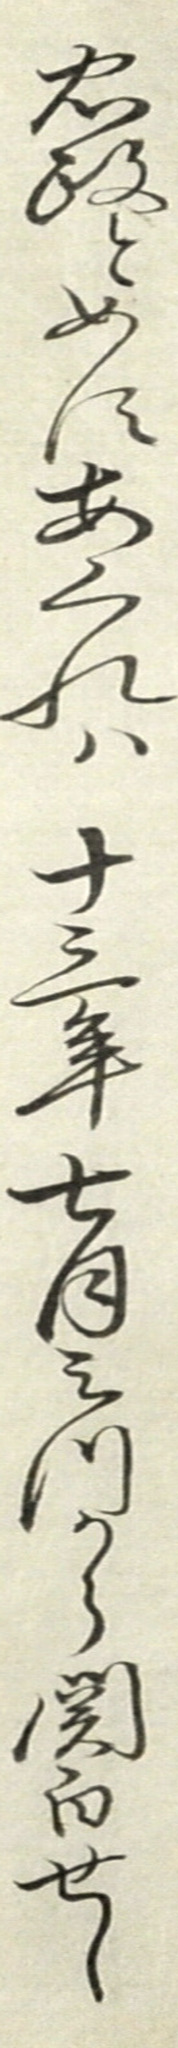忠政とめすあくれは十三年七月みつから関白せし
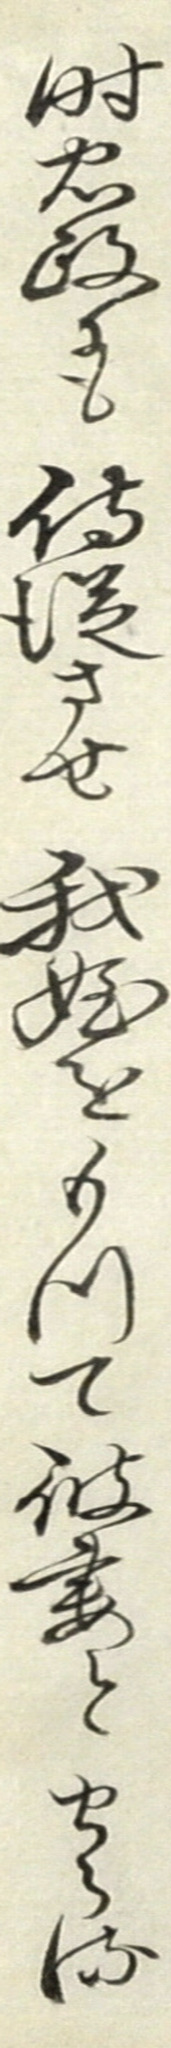時忠政にも侍従させ我姪をもつて彼妻とせらる
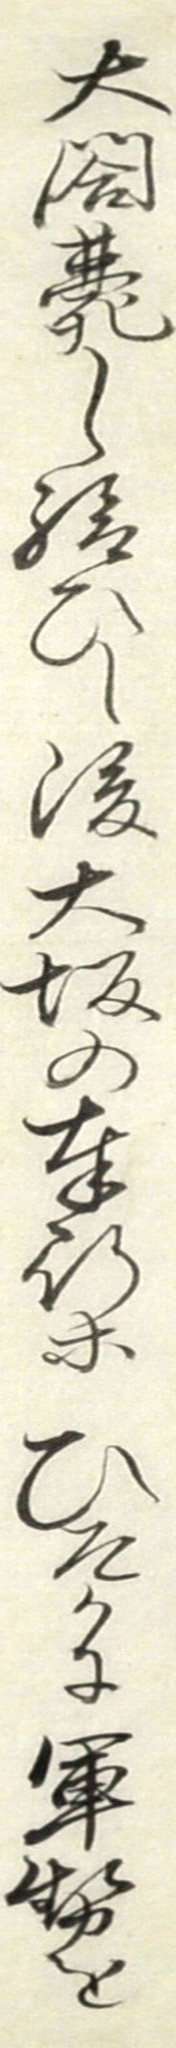太閤薨し給ひし後大坂の奉行等ひそかに軍勢を
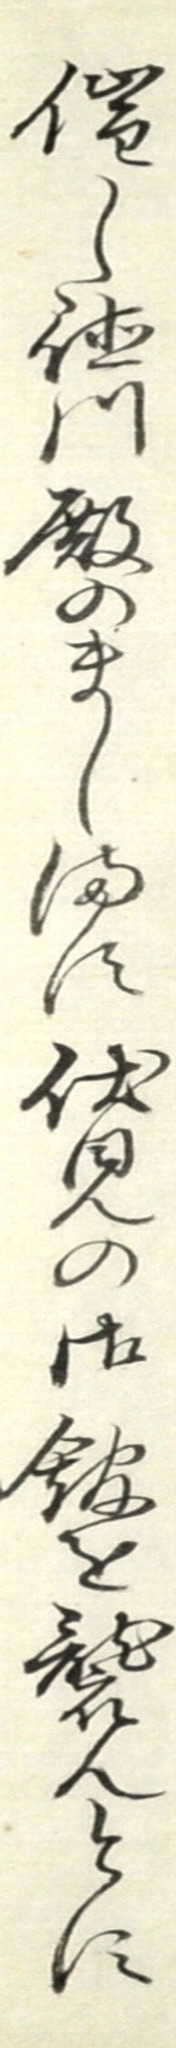催し徳川殿のまします伏見の御館を襲んとす
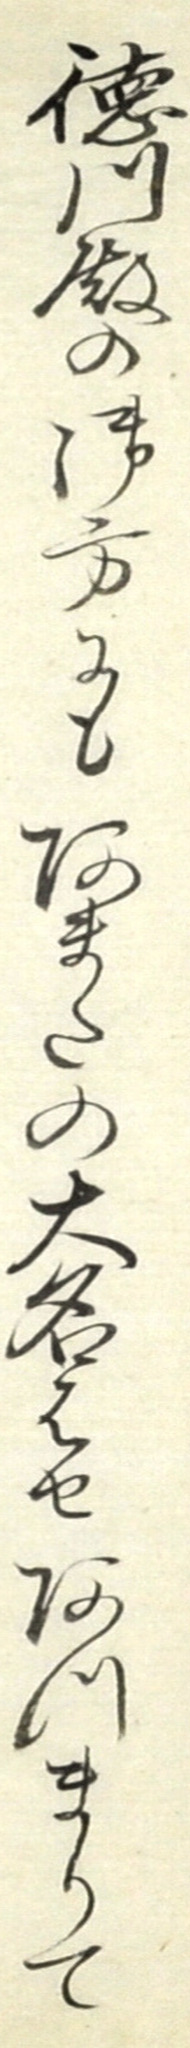徳川殿の御方にもあまたの大名はせあつまりて
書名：藩翰譜（七・下）
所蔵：伊那市立高遠町図書館・合同会社AMANE
